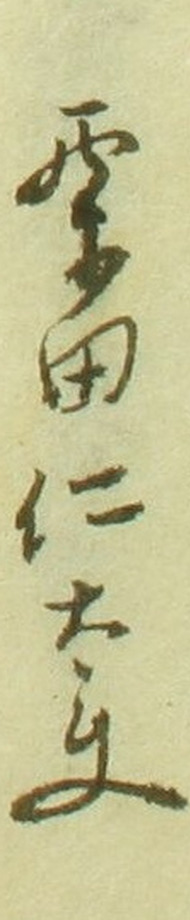栗田仁太夫
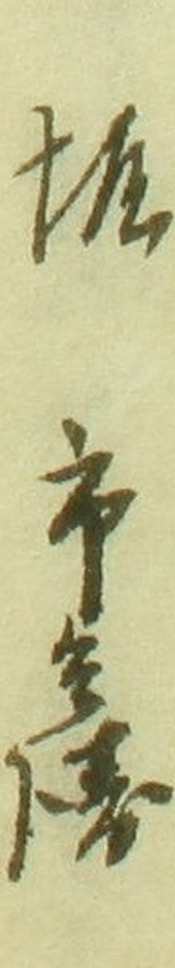堀市兵衛
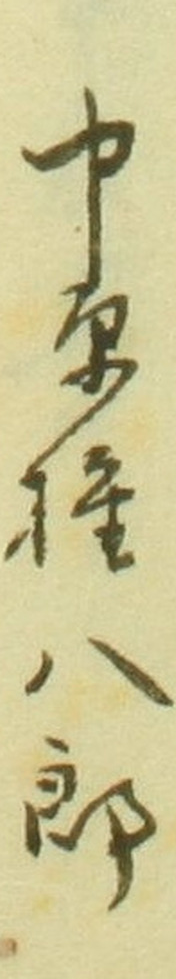中原権八郎
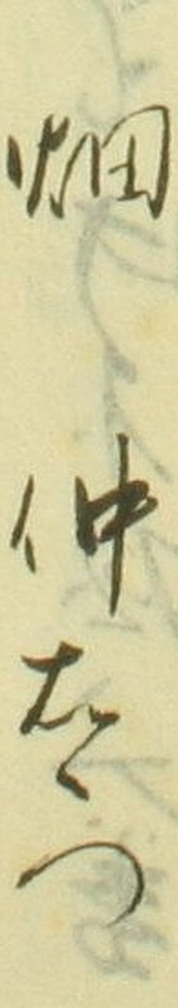畑仲右衛門
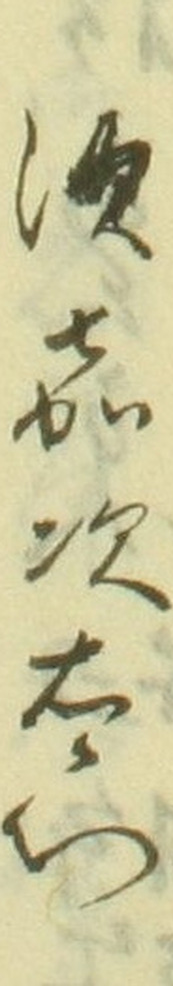嘉次右衛門
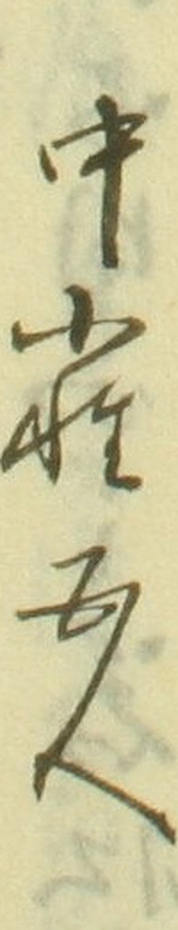中小姓五人
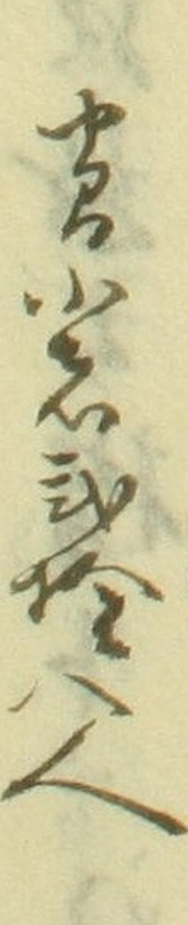中間小者弐拾八人
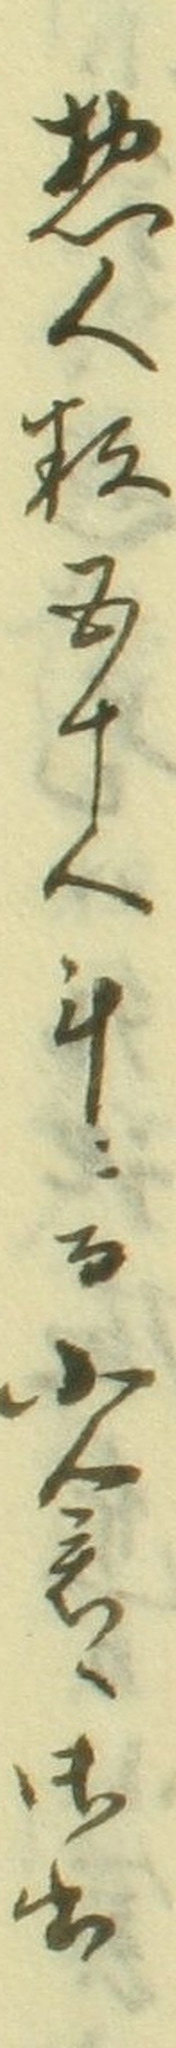惣人数五十人計ニ而小倉へ御出
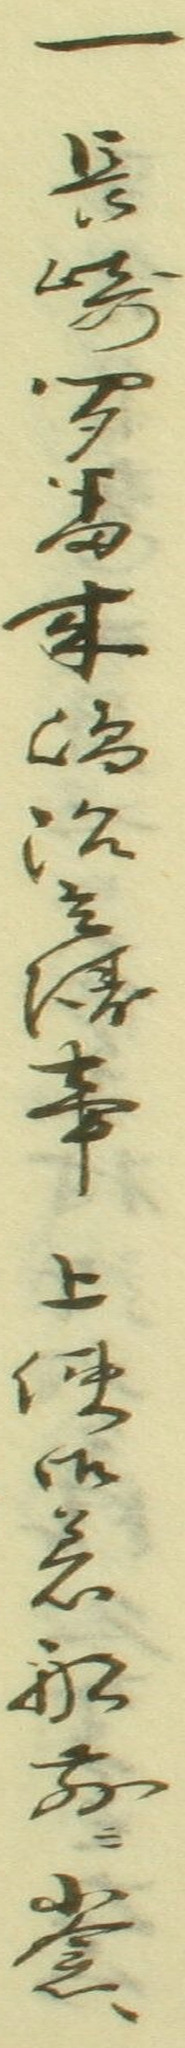一長崎聞番来島治兵衛事上使御着船前ニ小倉へ
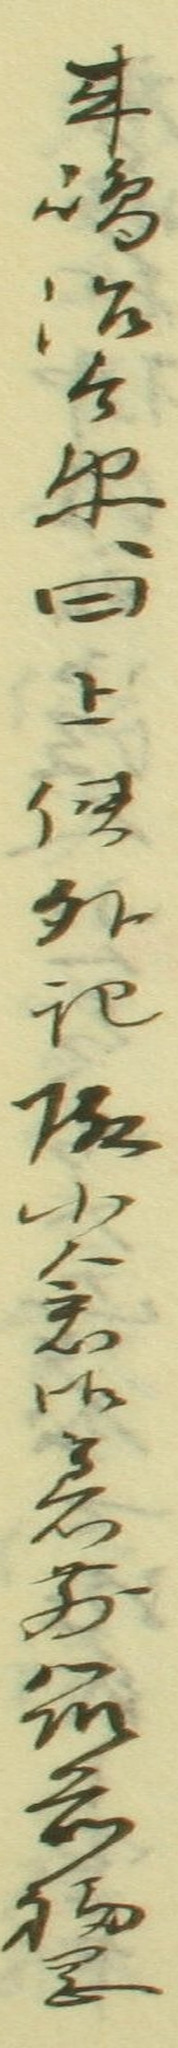来島治兵衛へ曰上使外記殿小倉御着前筑前福岡

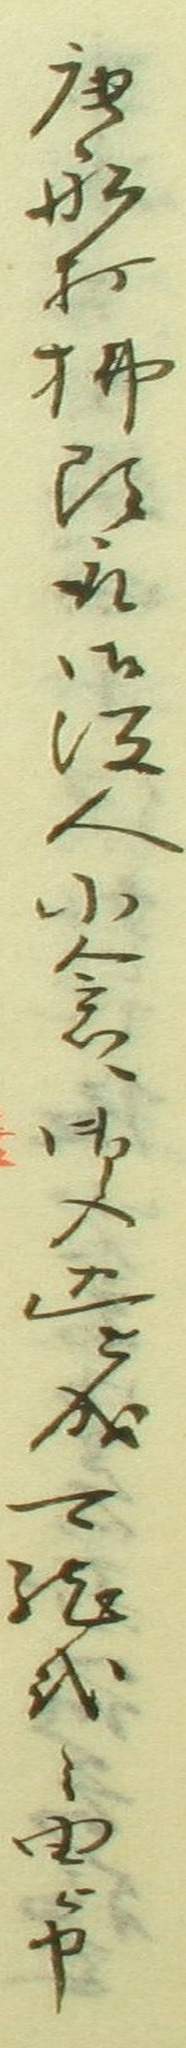唐船打払頭取御役人小倉へ御入込被成可然哉之由被申
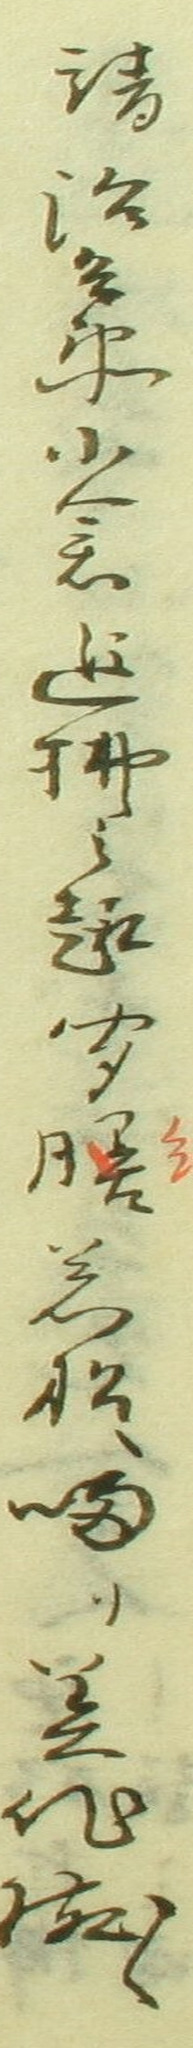請治兵衛小倉追払之趣聞繕若松へ帰り美作然々
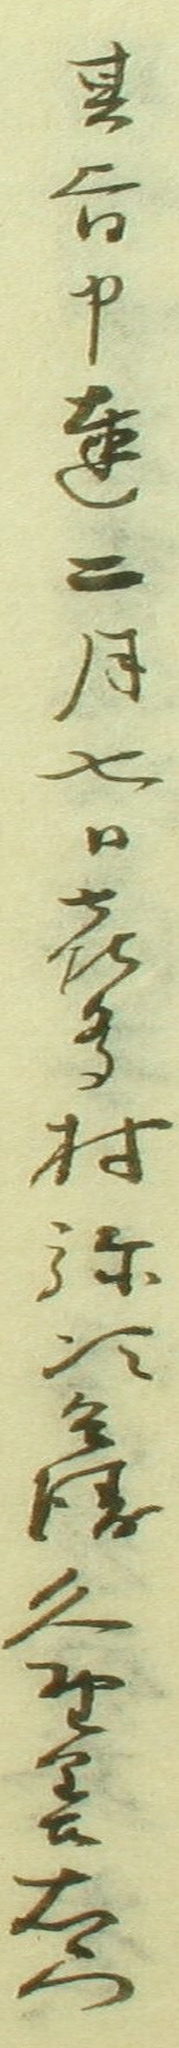其旨申達二月七日喜多村弥次兵衛久野善右衛門
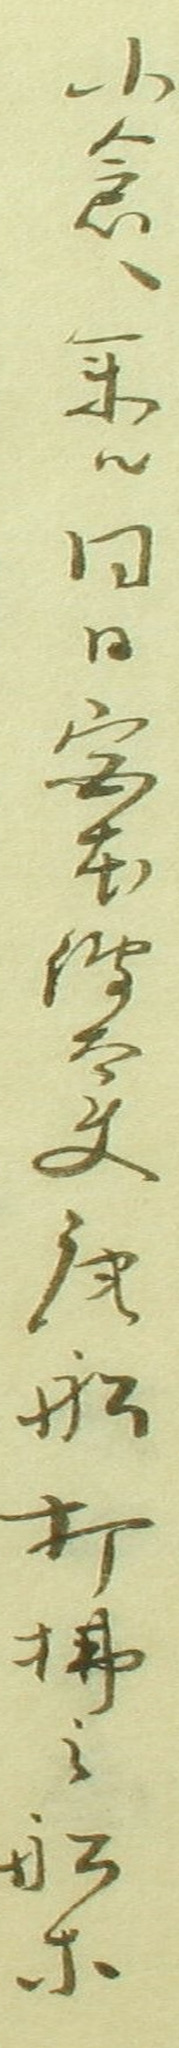小倉へ参候同日宮本傳太夫唐船打払之船に
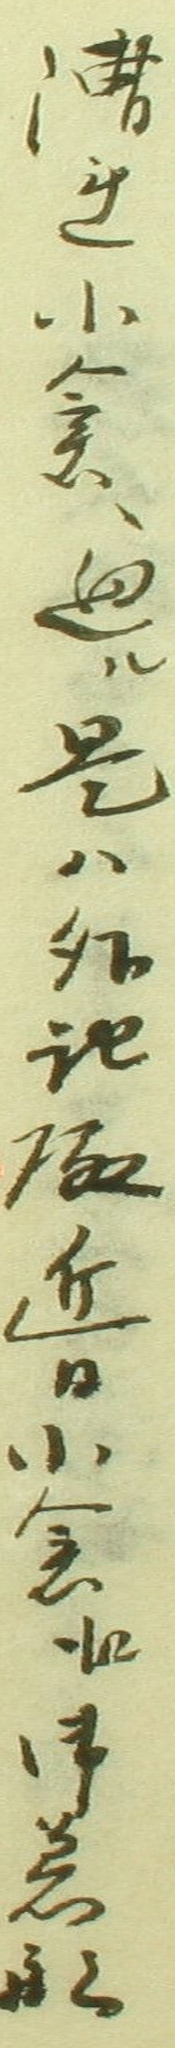漕連小倉へ廻ル是ハ外記殿近日小倉江御着船
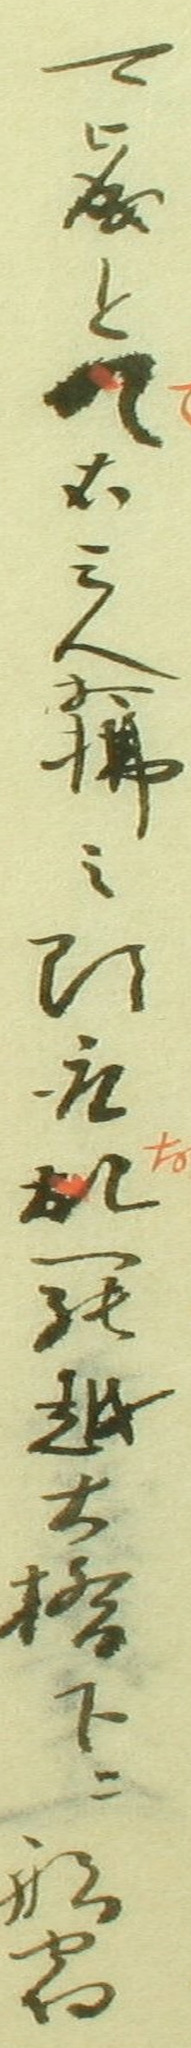可被成とて右三人打払之頭取故罷越大橋下ニ船宿
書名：唐船漂流記 二
